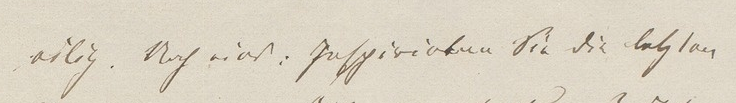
eilig. Noch eins: Inspicirten Sie die letzten
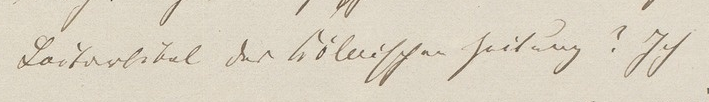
Leitartikel der Cölnischen Zeitung? Ich
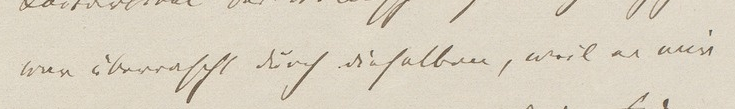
war überrascht durch dieselben, weil es mir
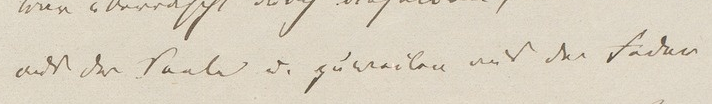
aus der Seele u. zuweilen aus der Feder
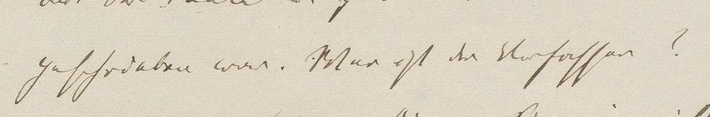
geschrieben war. Wer ist der Verfasser?
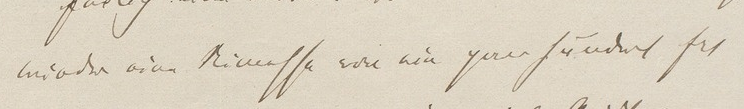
wieder eine Rimesse von ein paar hundert frs
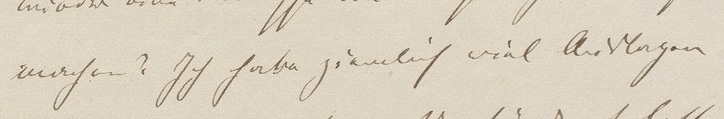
machen? Ich habe ziemlich viel Auslagen
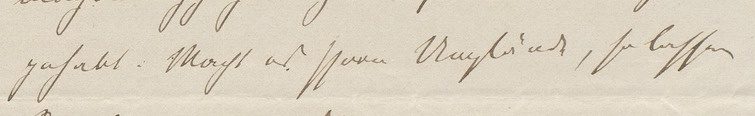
gehabt. Macht es Ihnen Umstände, so lassen
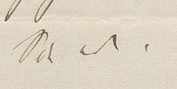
sie es.
